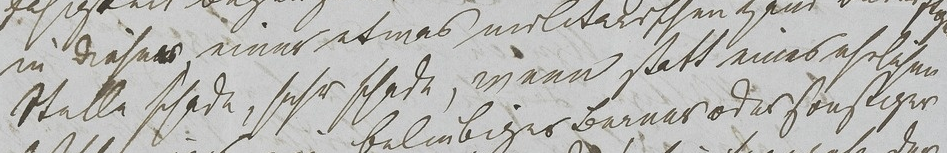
Stelle schade, sehr schade, wenn statt eines ehrlichen
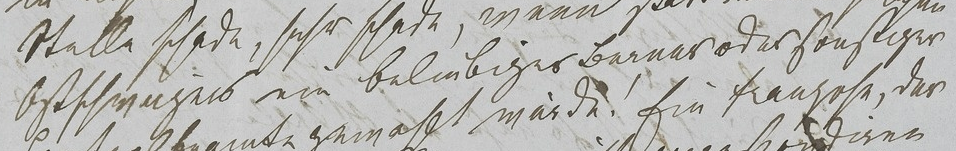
Ostschweizers ein beliebiger Berner oder sonstiger
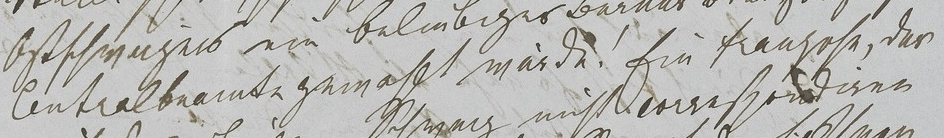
Centralbeamte gewählt würde! Ein Franzose, der
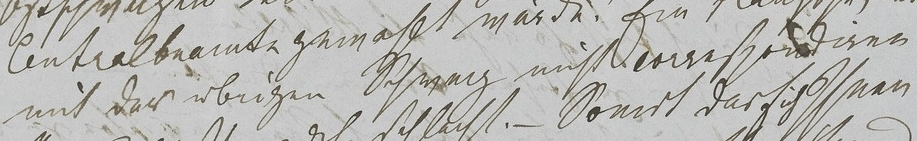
mit der übrigen Schweiz nicht correspondiren
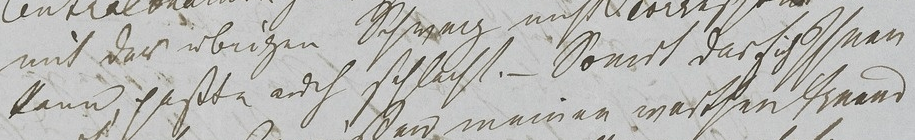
kann, paßte auch schlecht. – Somit darf ich Ihnen
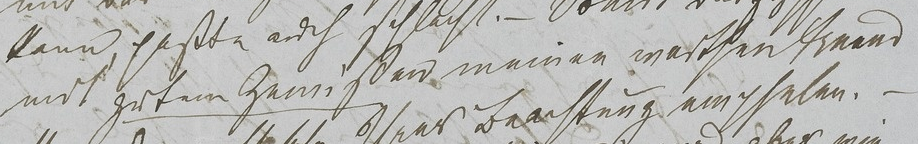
mit gutem Gewißen meinen werthen Freund
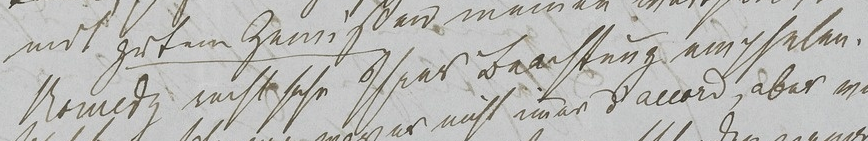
Romedy recht sehr Ihrer Beachtung emphelen.
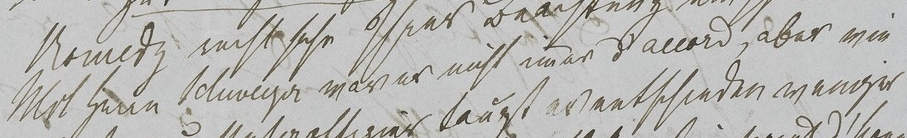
Mit Herrn Schweizer war er nicht immer d'accord, aber wie
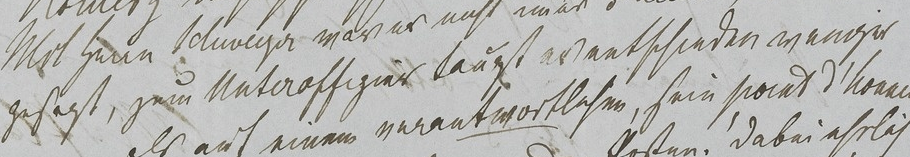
gesagt, zum Unteroffizier taugt er entschieden weniger
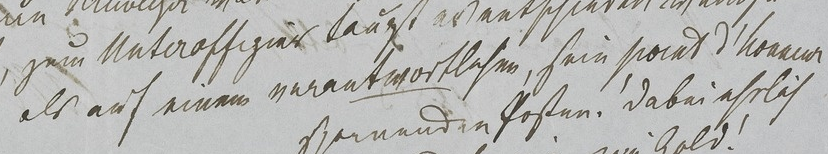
als auf einem verantwortlichen, sein point d'honneur
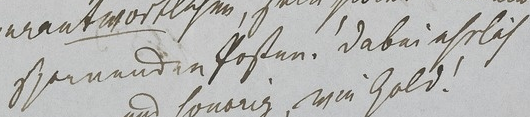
spornenden Posten! Dabei ehrlich
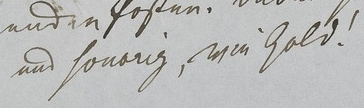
und honorig, wie Gold!
